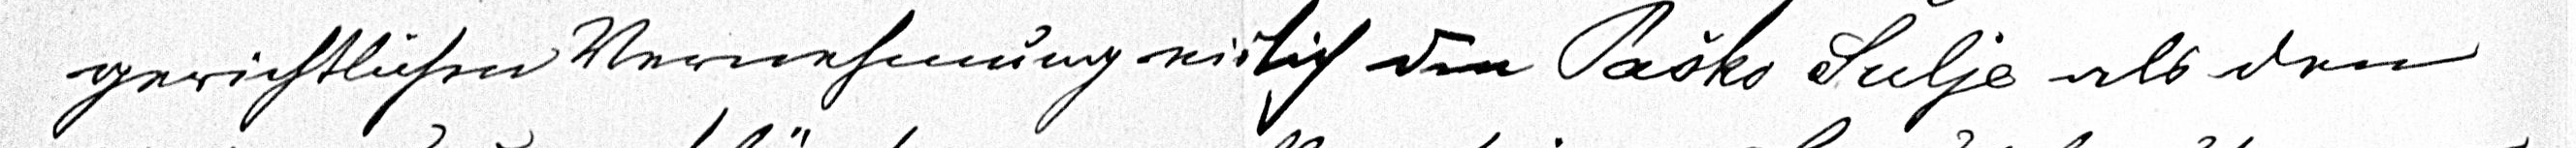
gerichtlichen Vernehmung eidlich den Paško Šulje als den
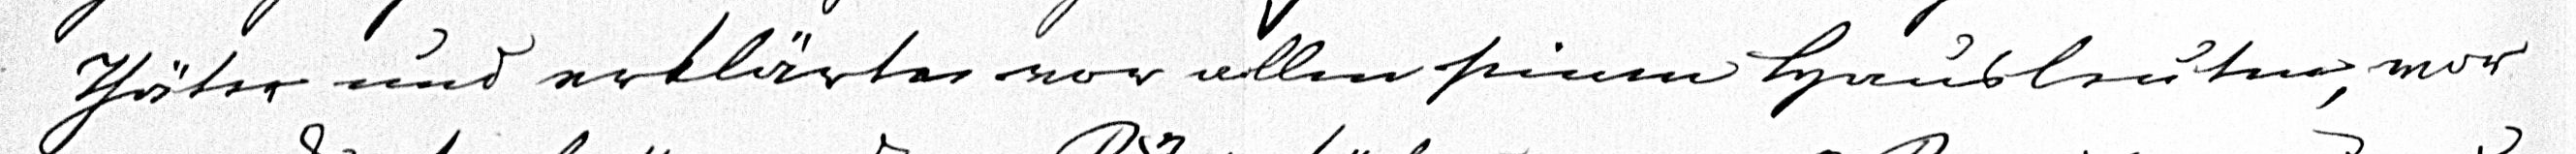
Thäter und erklärter vor allen seinen Hausleuten, vor
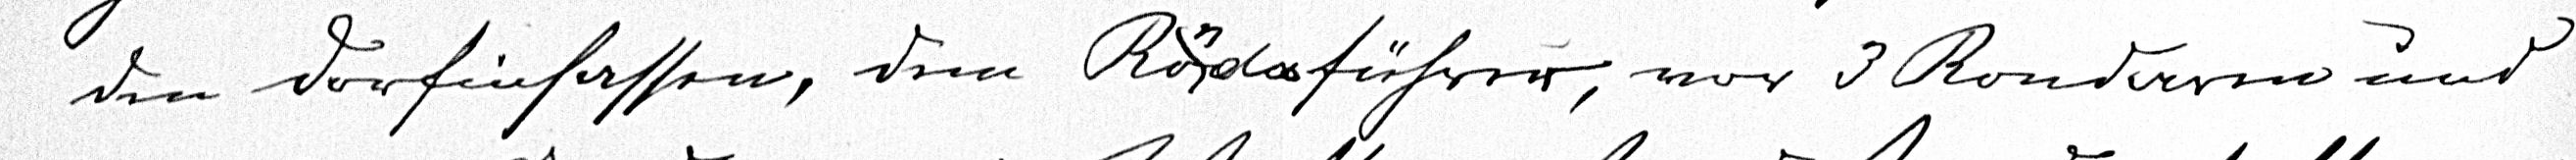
den Dorfinsassen, dem Rondaführer, vor 3 Rodaren und
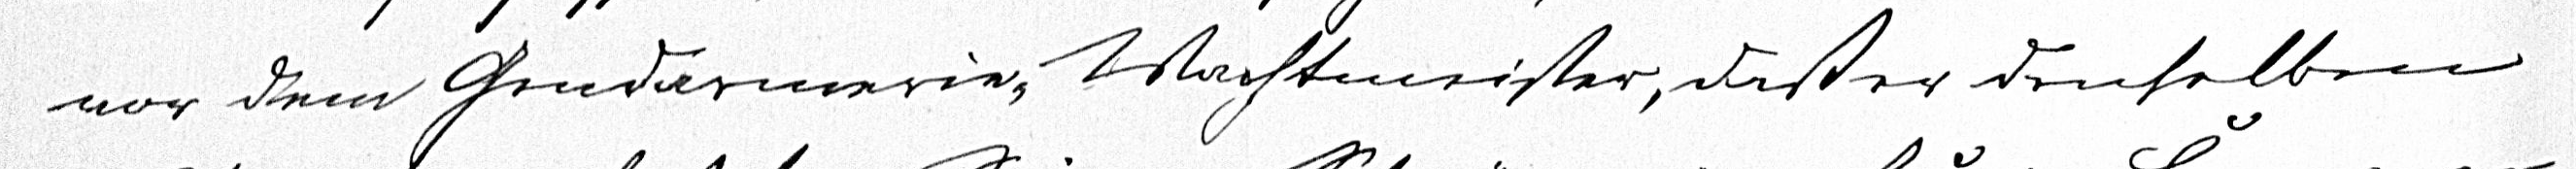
vor dem Gendarmerie-Wachtmeister, daß er denselben
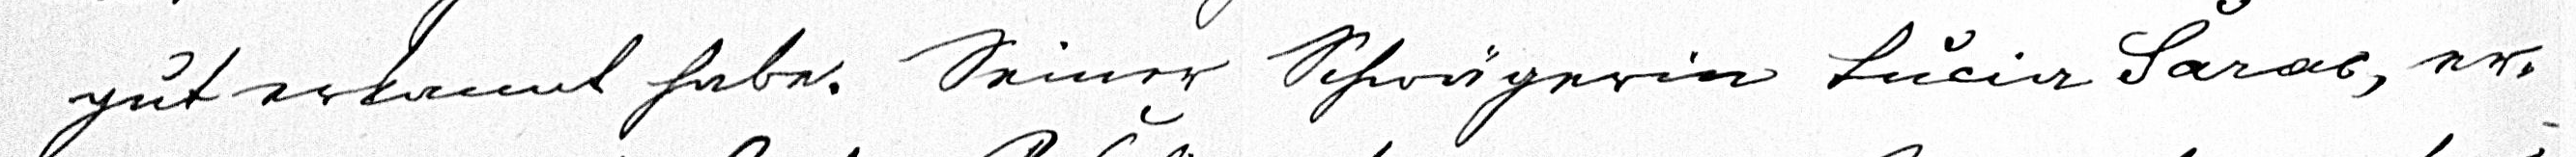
gut erkannt habe. Seiner Schwägerin Lucia Šarac, er¬
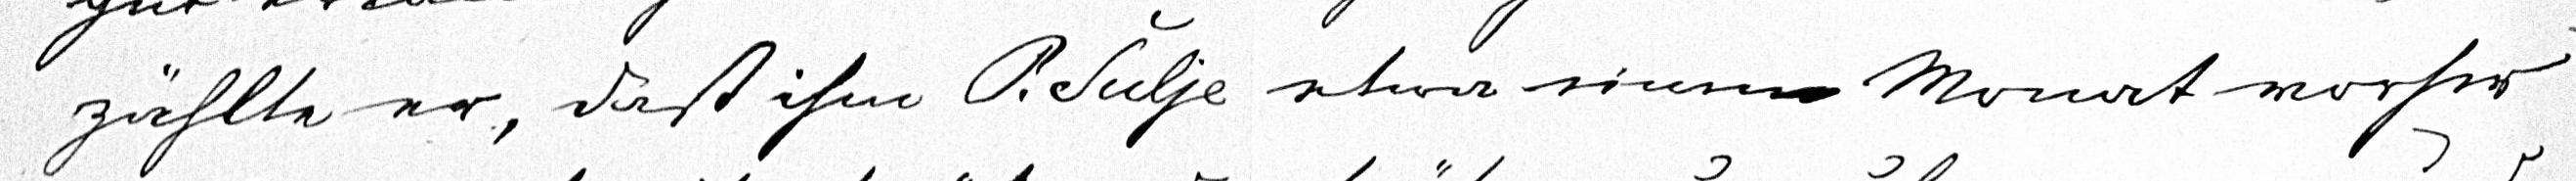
zählte er, daß ihm P. Šulje etwa einem Monat vorher
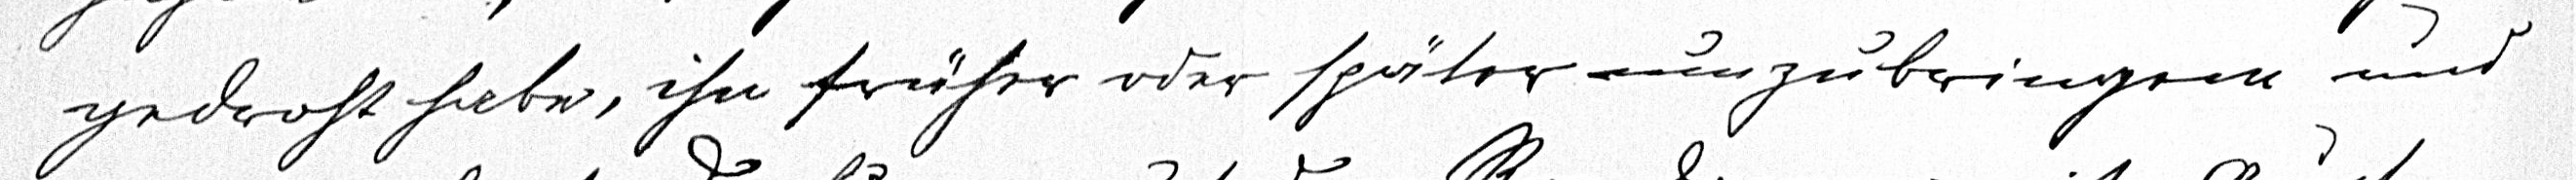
gedroht habe, ihm früher oder später umzubringen und
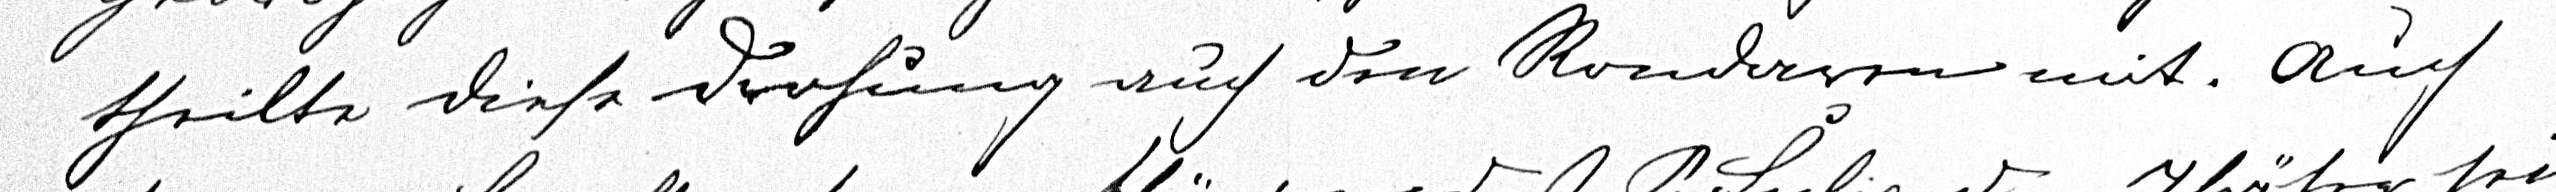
theilte diese Drohung auch den Rondaren mit.Auch
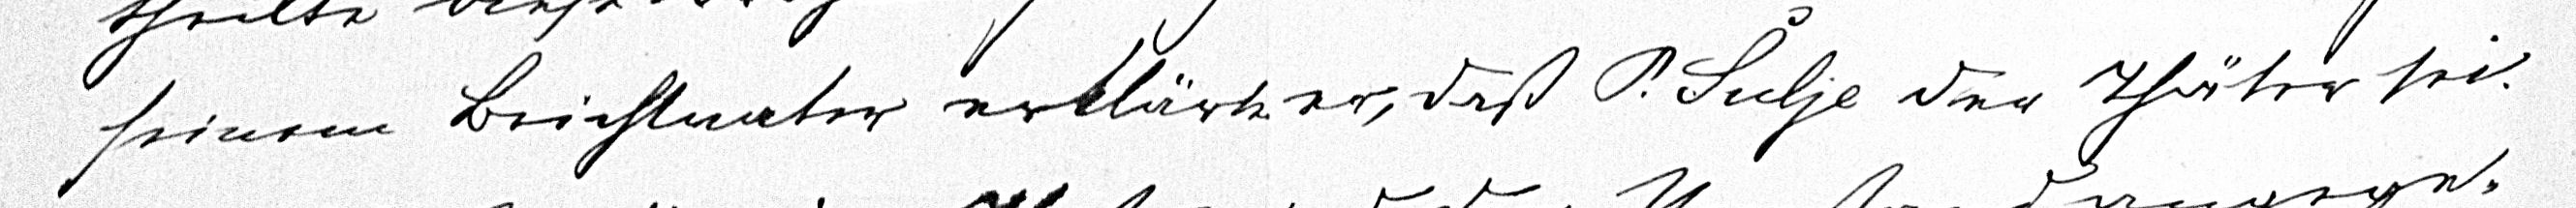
seinem Beichtvater erklärte er, daß P. Šulje der Thäter sei.
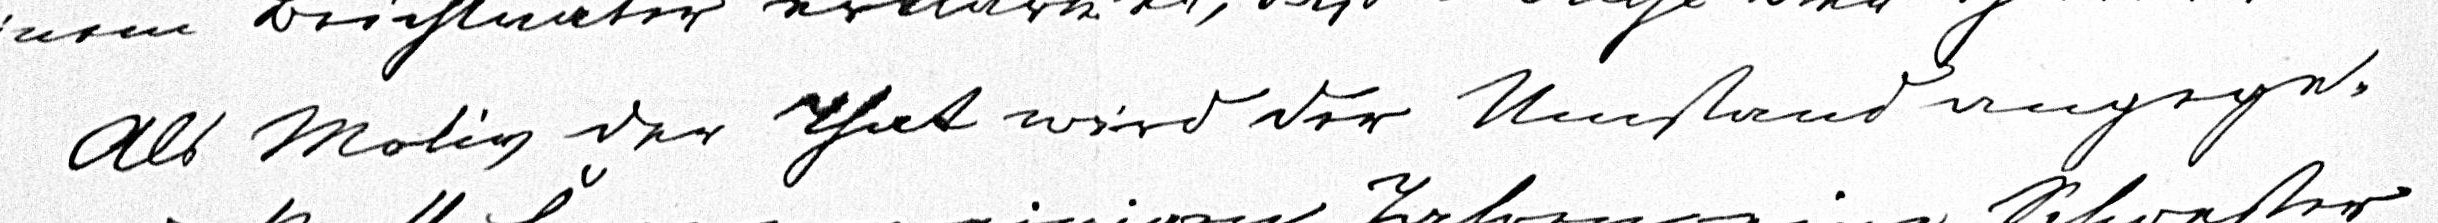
Als Motiv der That wird der Umstand angege¬
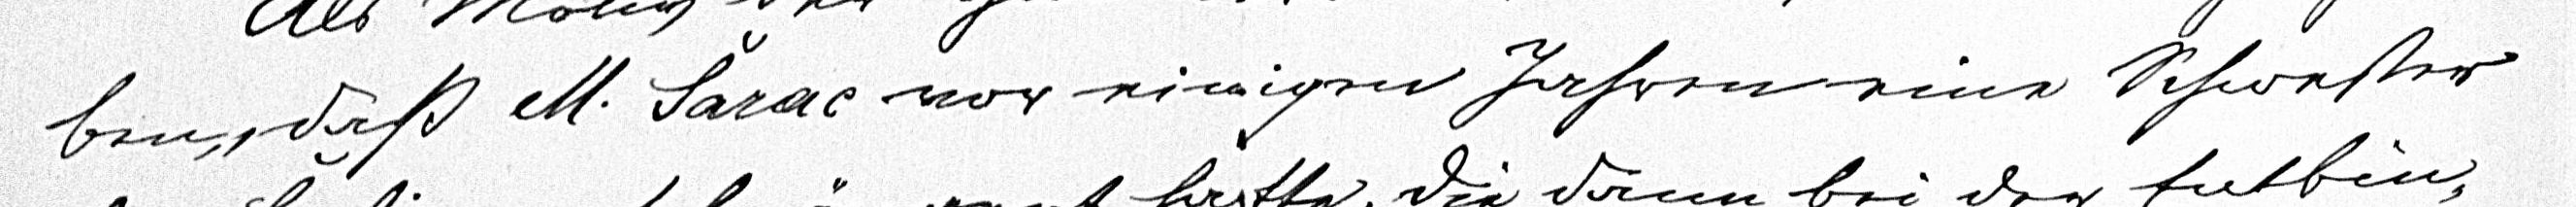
ben, daß M. Šarac vor einigen Jahren eine Schwester
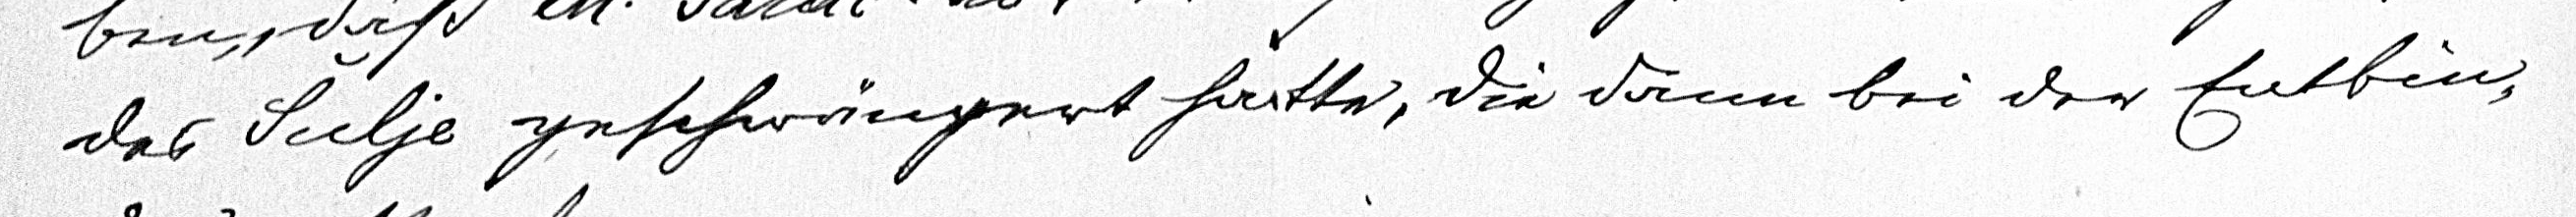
des Šulje geschwängert hatte, die dann bei der Entbin¬
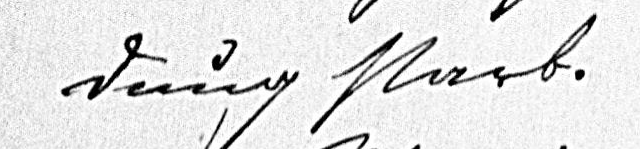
dung starb.
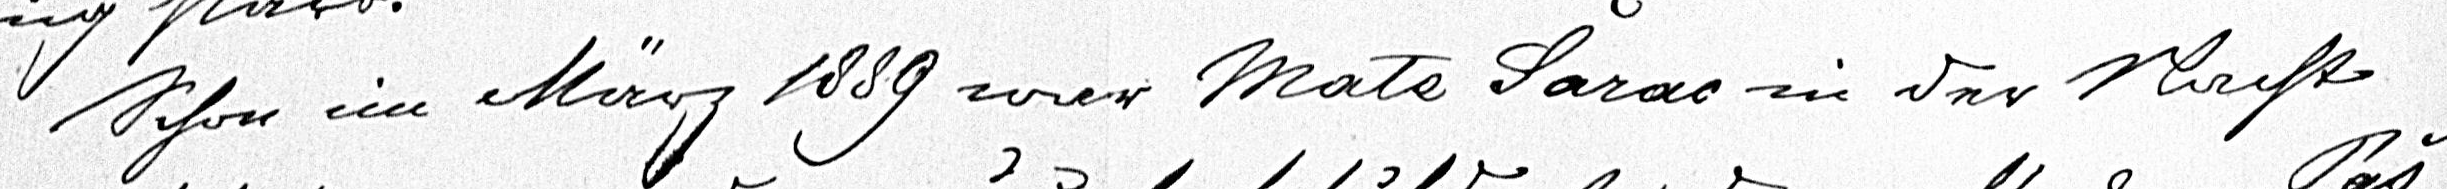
Schon im März 1889 war Mate Šarac in der Nacht
